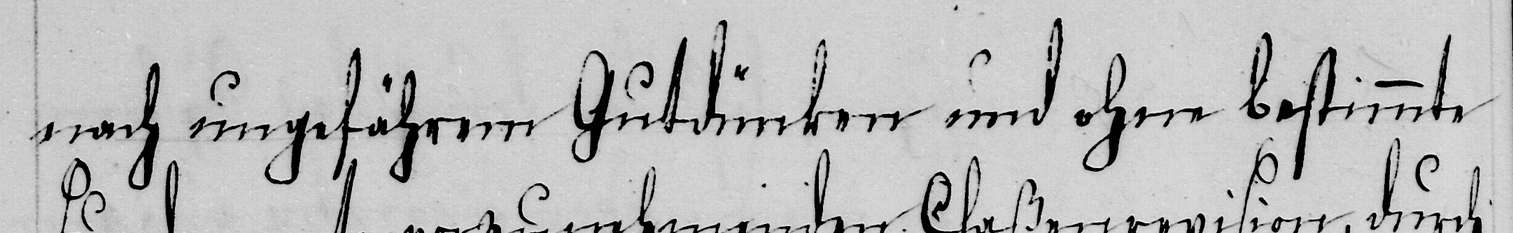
nach ungefährem Gutdünken und ohne bestimmte
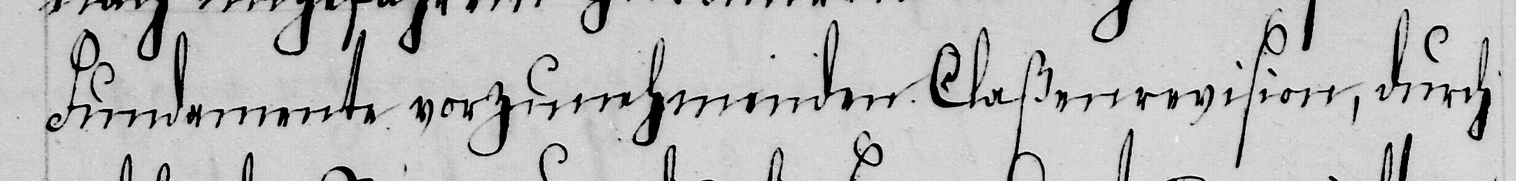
Fundamente vorzunehmenden Claßenrevision, durch
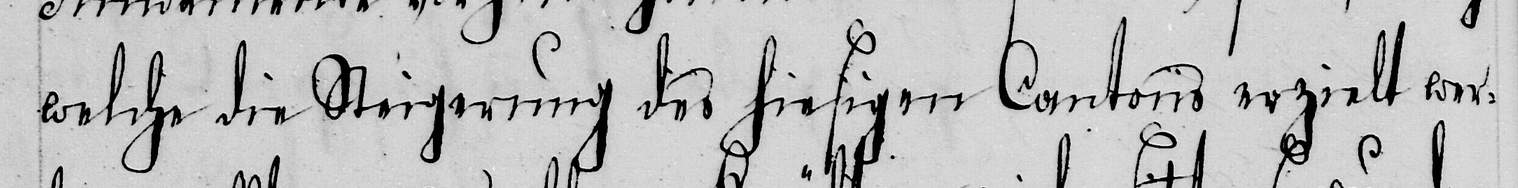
welche die Steigerung des hiesigen Cantons erzielt wer¬
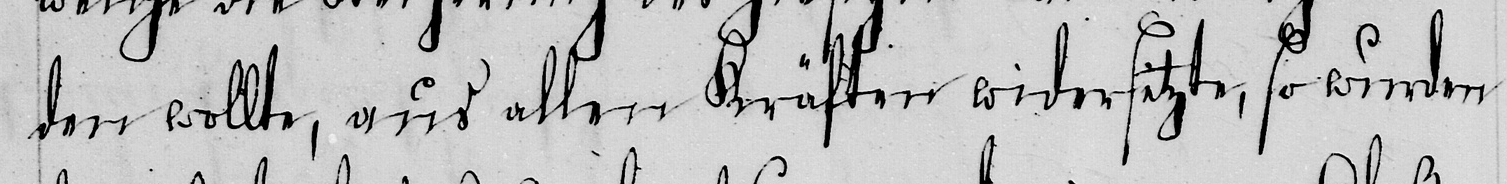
den wollte, aus allen Kräften widersetzte, so wurden
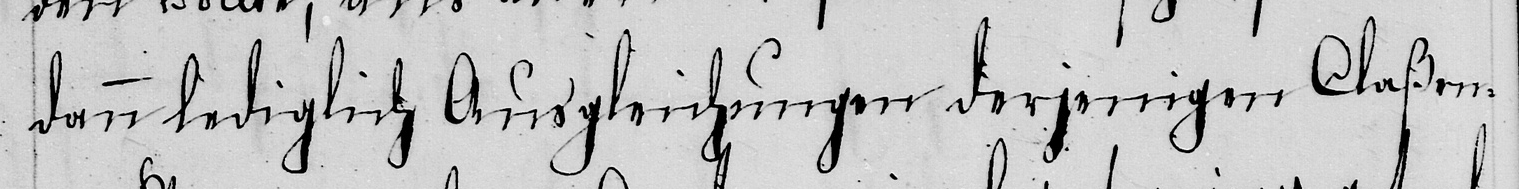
dann lediglich Ausgleichungen derjenigen Claßen¬
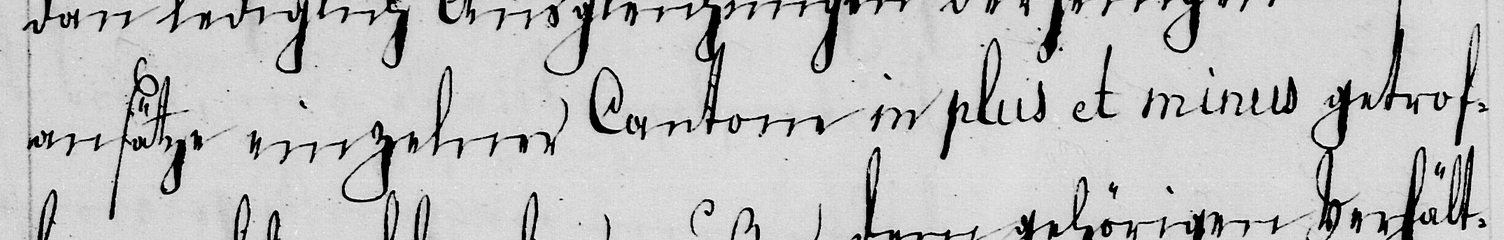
ansätze einzelner Cantone in plus et minus getrof¬
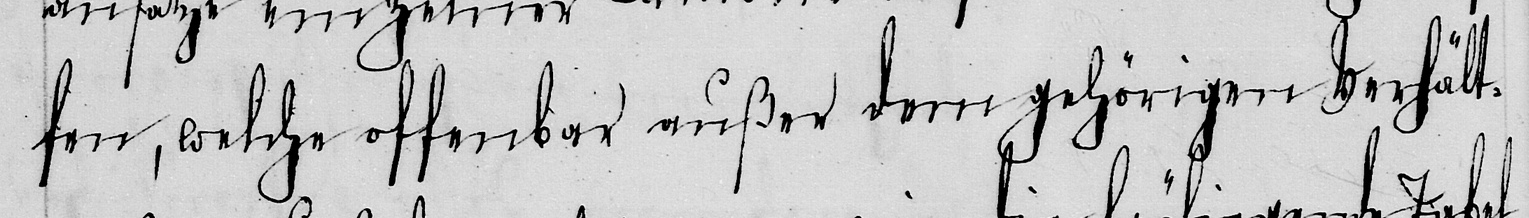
fen, welche offenbar außer dem gehörigen Verhält¬
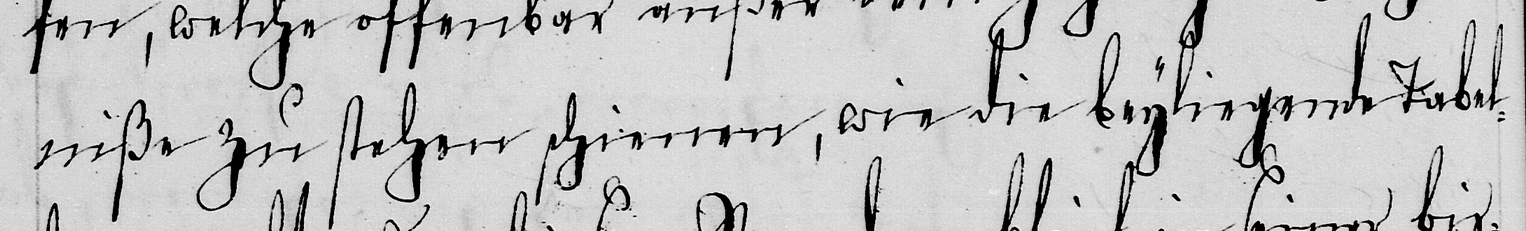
niße zu stehen schienen, wie die beyliegende Tabel¬
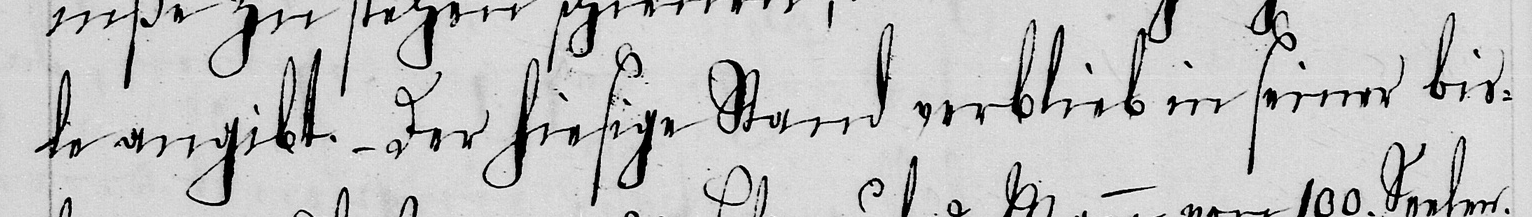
le angibt. Der hiesige Stand verblieb in seiner bis¬
